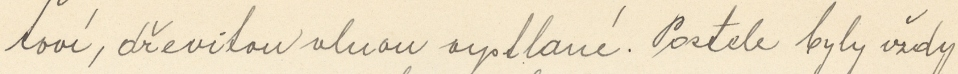ťoví, dřevitou vlnou vystlané. Postele byly vždy
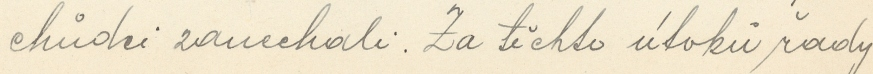chůdci zanechali. Za těchto útoků řady
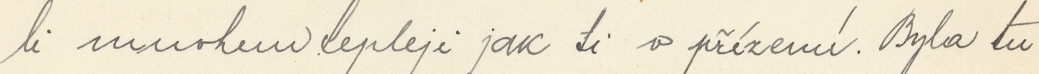li mnohem tepleji jak ti v přízemí. Byla tu
